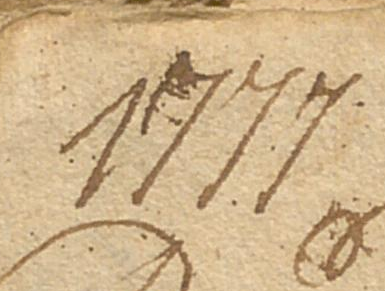1777
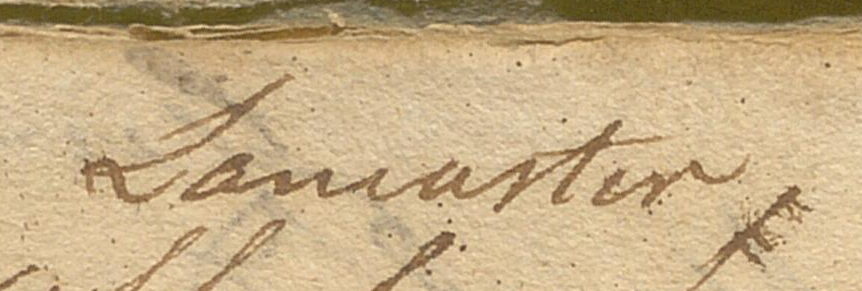Lancaster
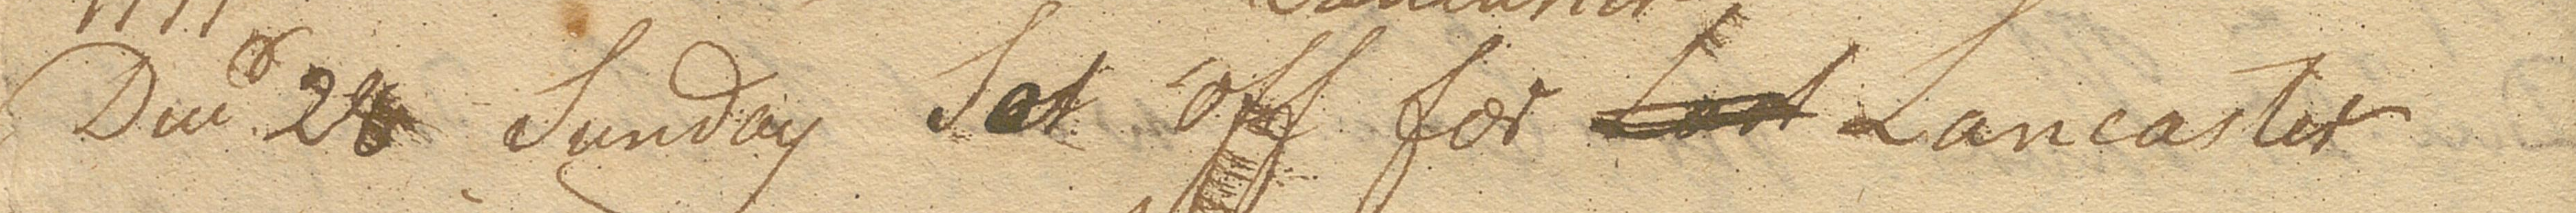Dec^r. 2 Sunday set off for [Last] Lancaster
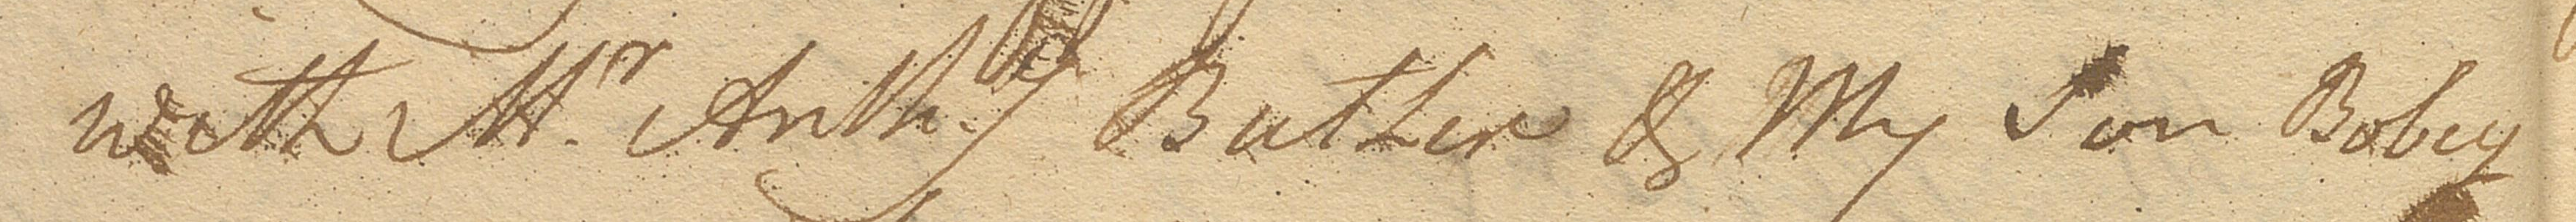with M^r. Anth^y. Butler & My Son Bobey
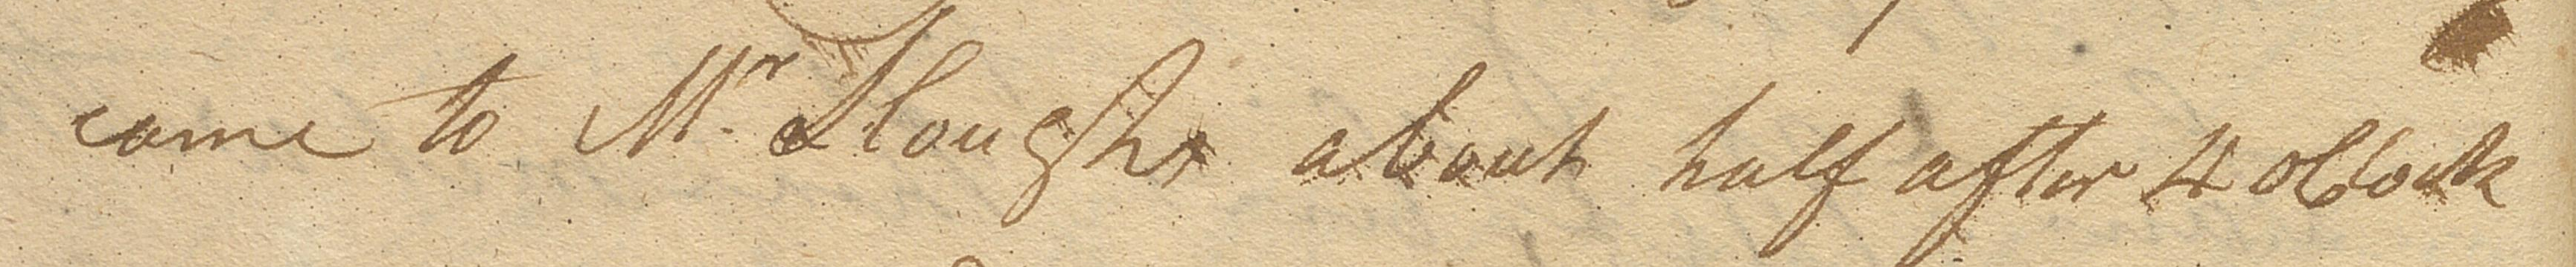came to M^r. Sloughs about half after 4 oClock
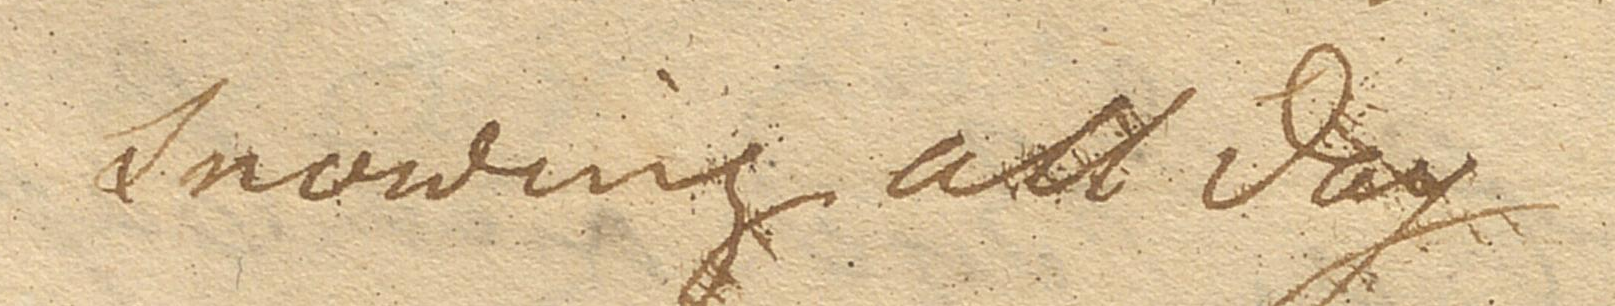snowing all day
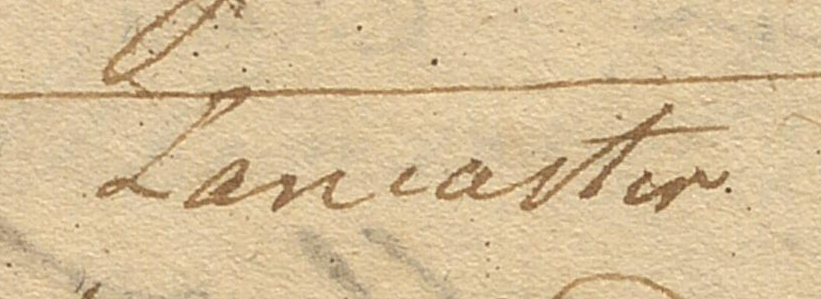Lancaster
